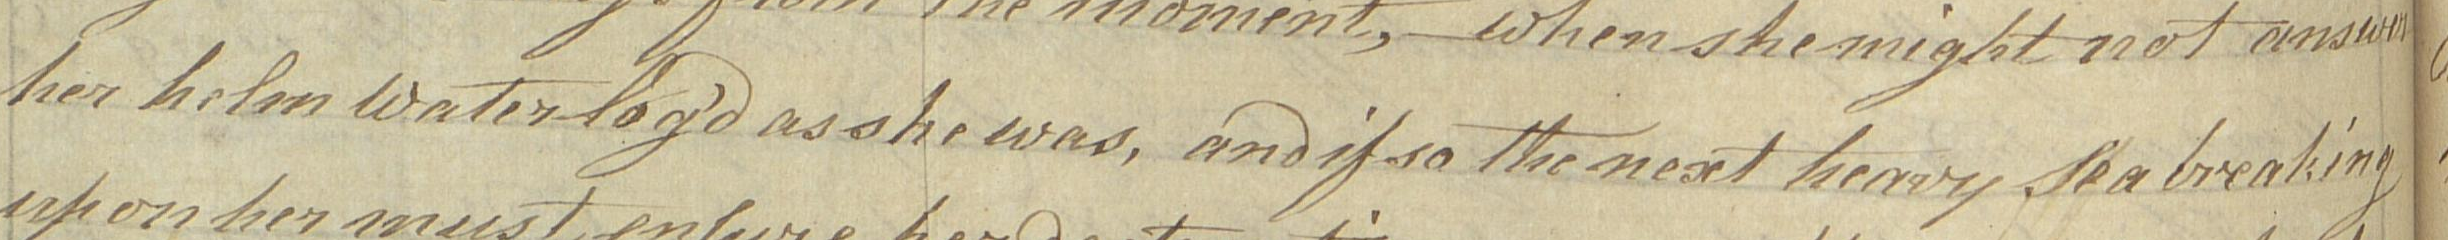her helm Waterlog'd as she was, and if so the next heavy sea breaking
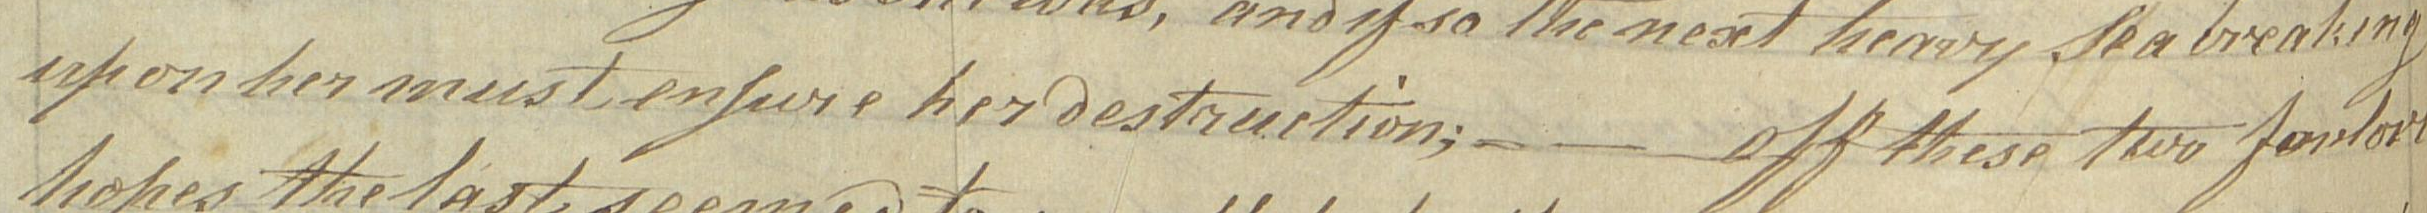upon her must ensure her destruction; off these two forlorn
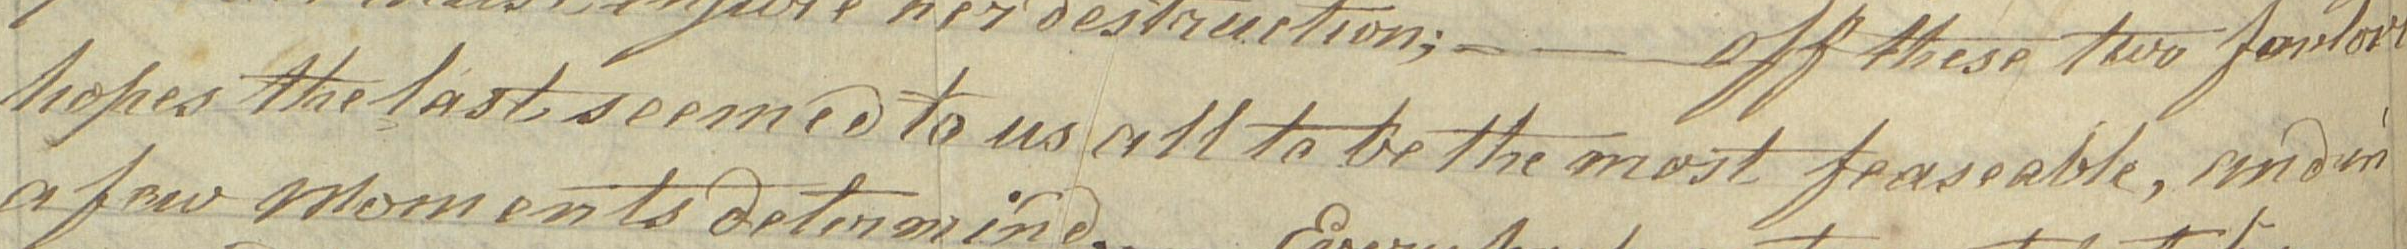hopes the last seemed to us all to be the most feaseable, and in
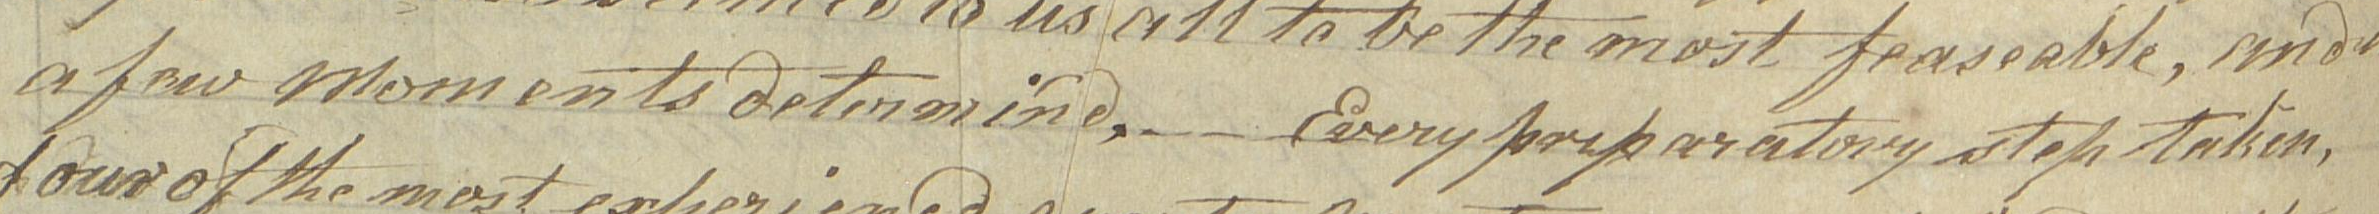a few Moments determind, Every preparatory stop taken,
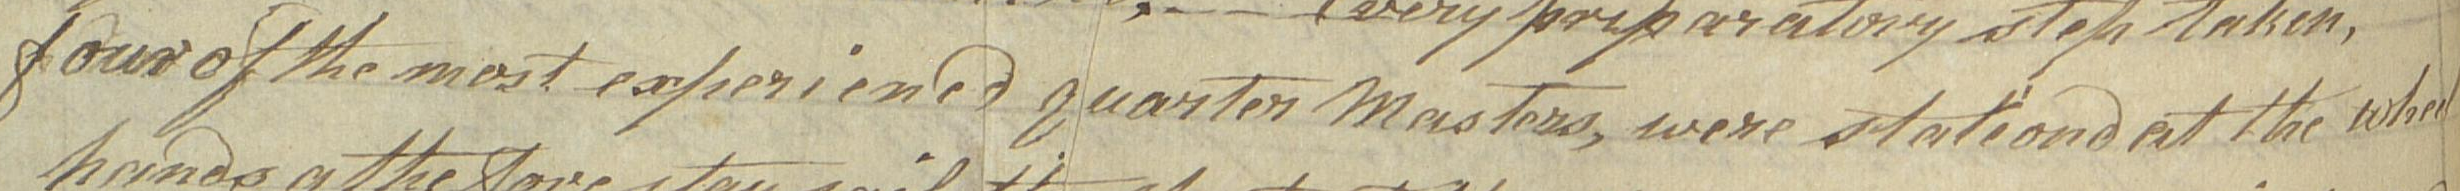four of the most experiencd quarter Masters, were stationd at the wheel
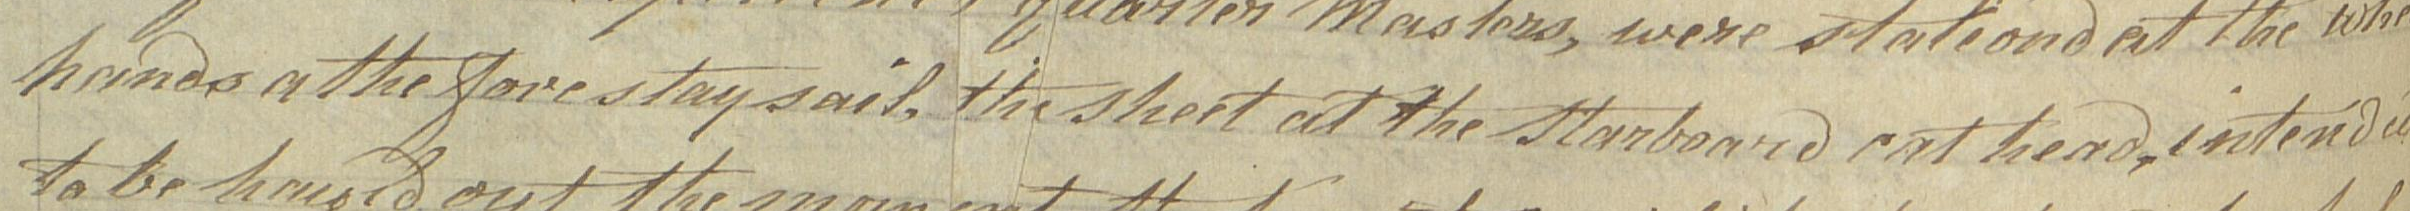hands a the fore stay sail, the sheet at the starboard cat head, intended
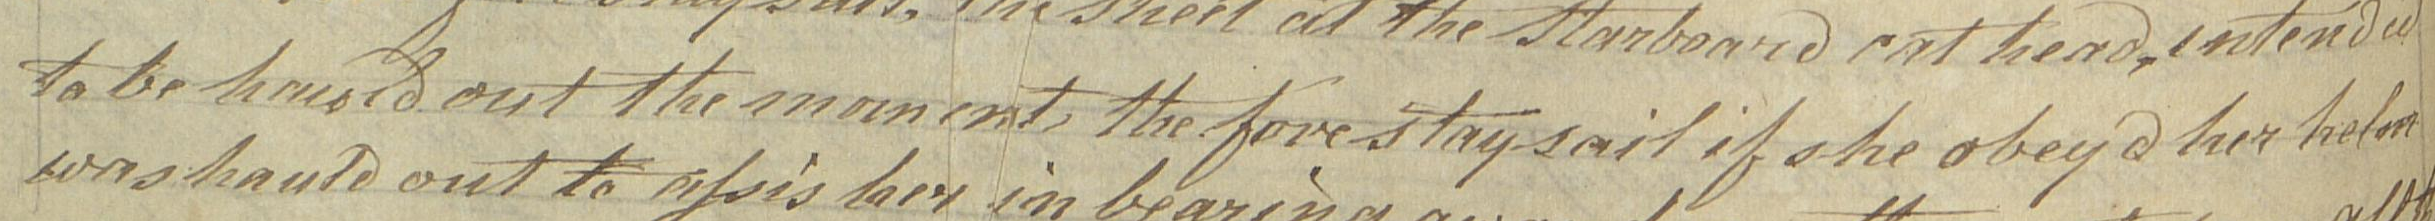to be hauld out the moment the fore stay sail if she obey'd her helo-
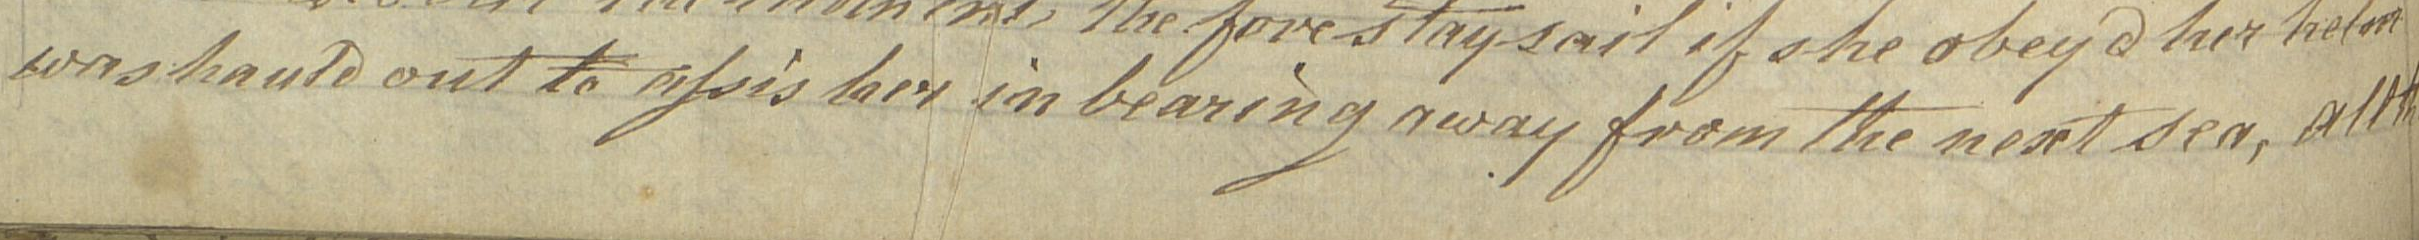was hauld out to assis her in bearing away from the next sea, all the
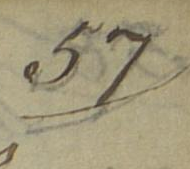57
